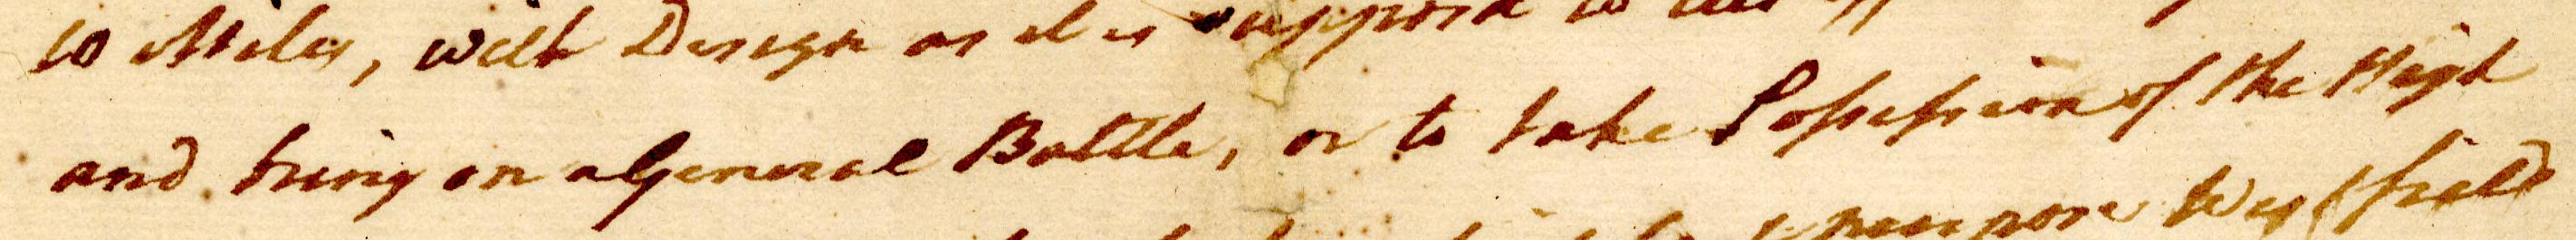and bring on a General Battle, or to take Possession of the High
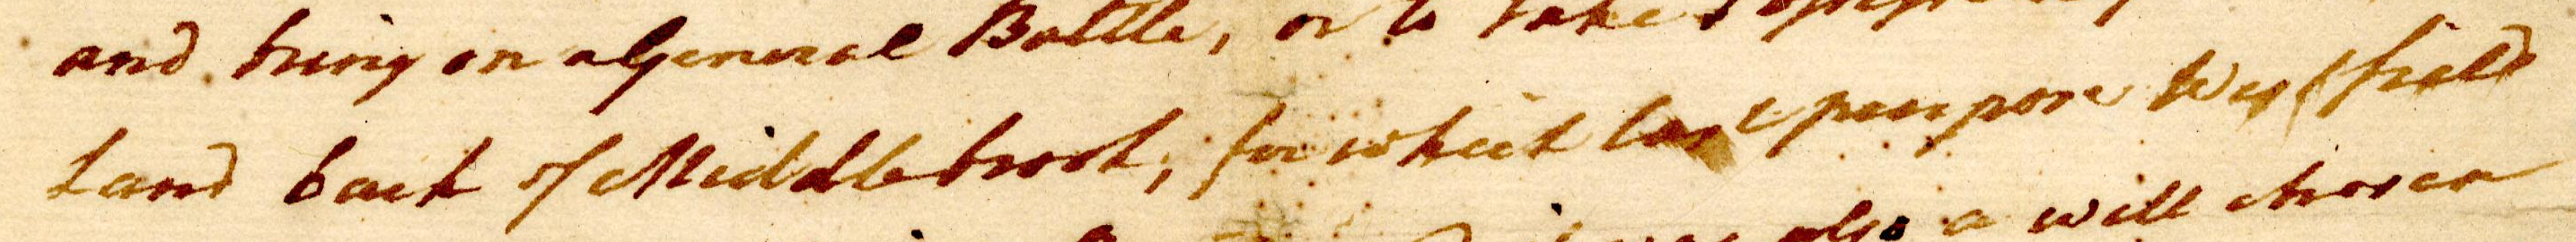Land back of Middlebrook, for which last purpose Westfield
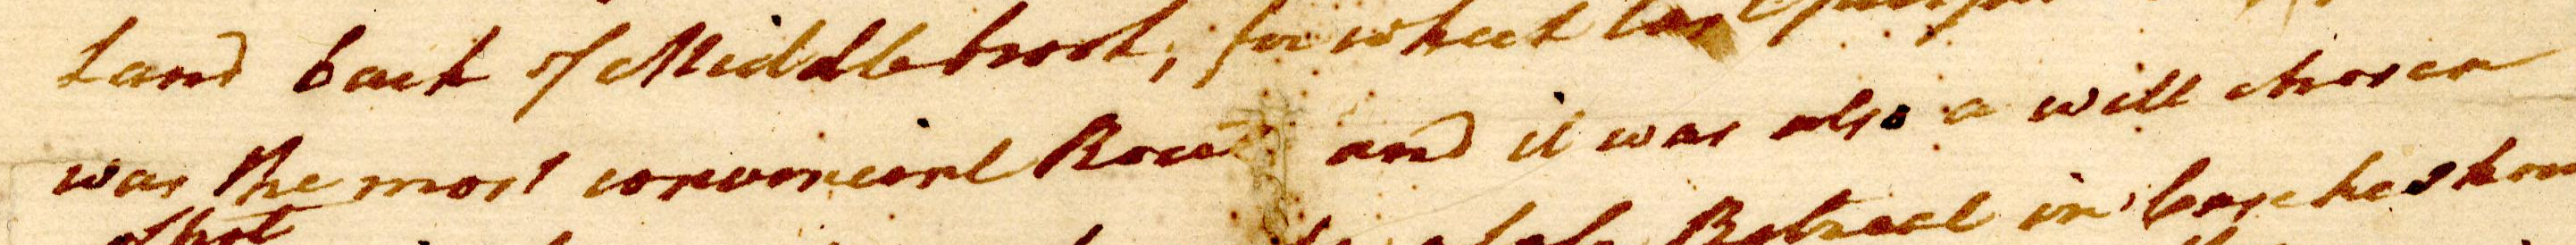was the most convenient Rout; and it was also a well chosen
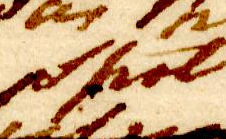Spot
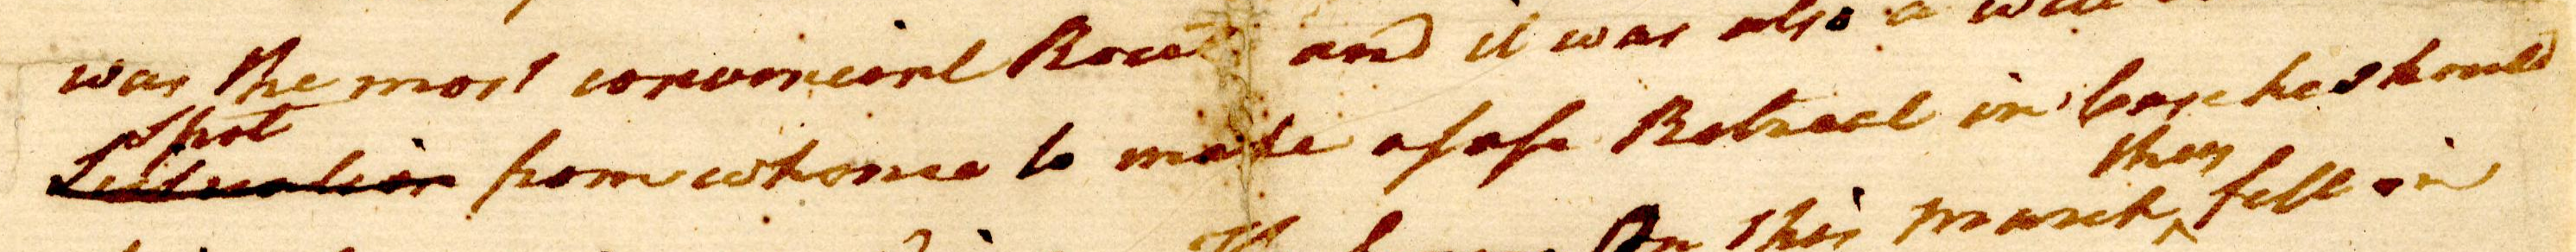[Situation] from whence to make a safe retreat in case he should
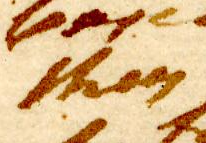they
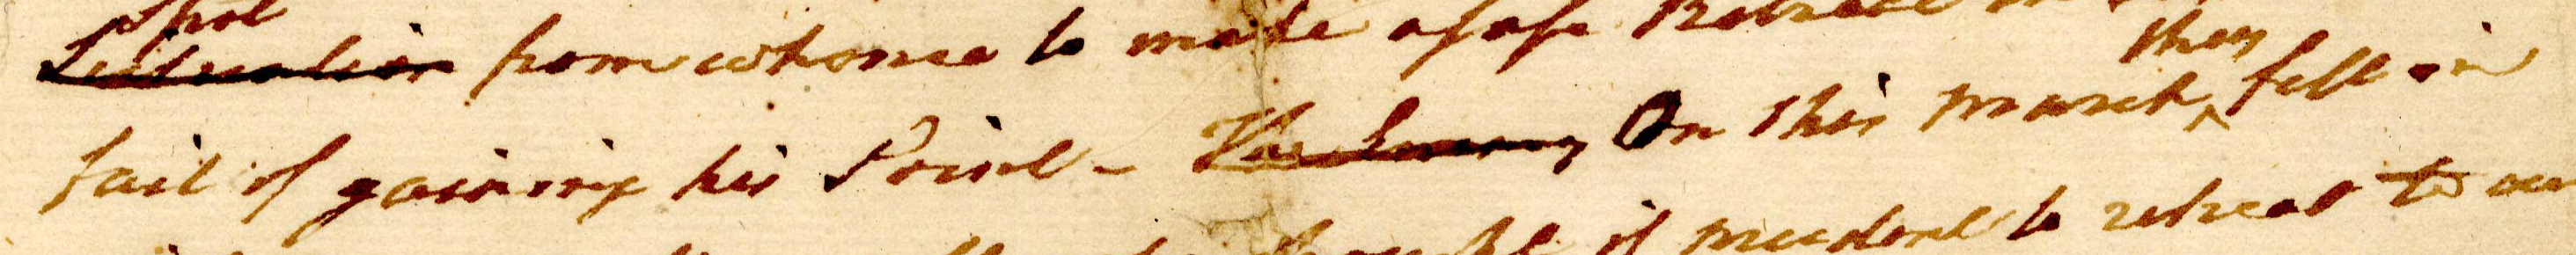fail of gaining his Prize- [The Enemy] On this march fell in
